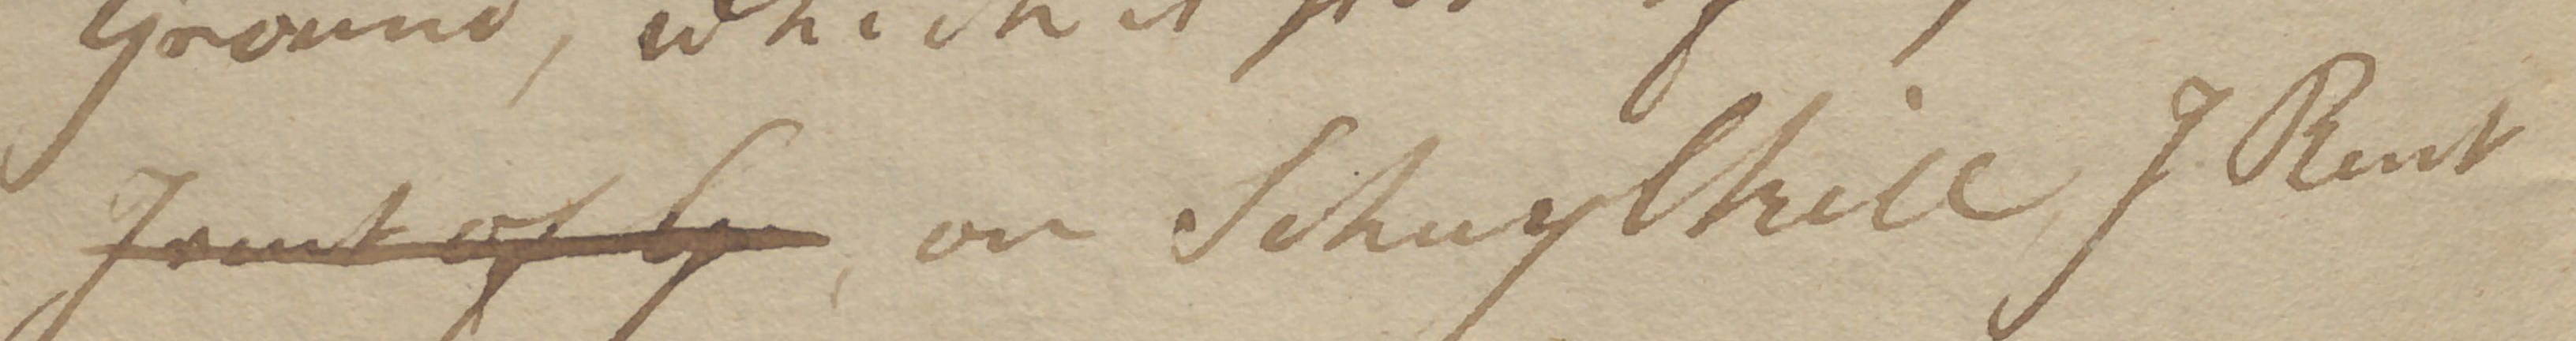[I rent of G] on Schuylkill I Rent
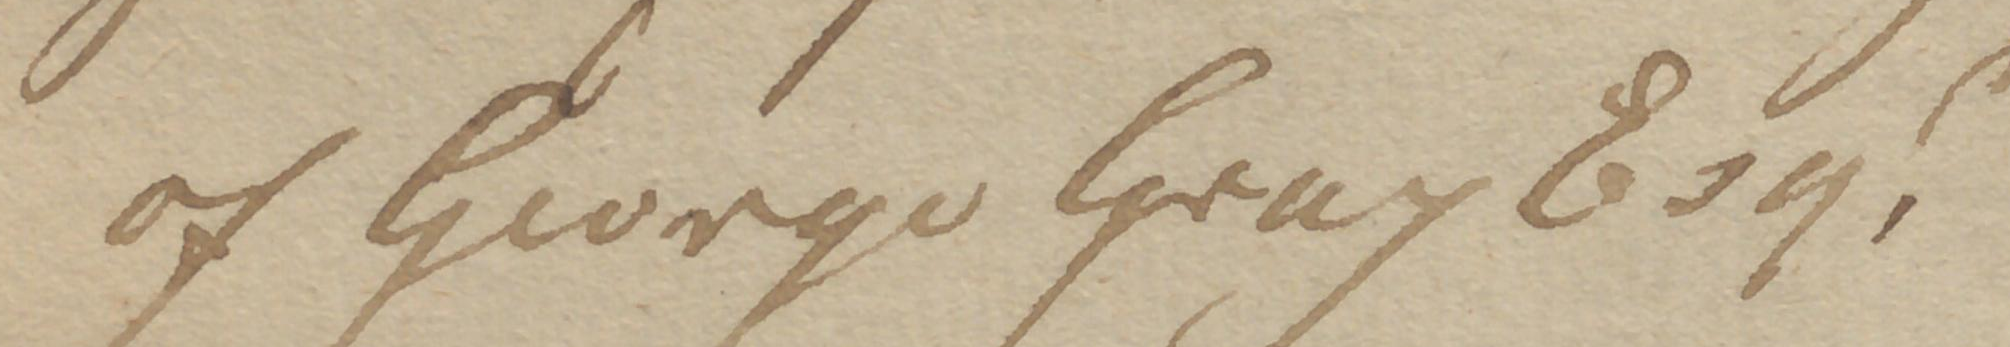of George Gray Esq^r,
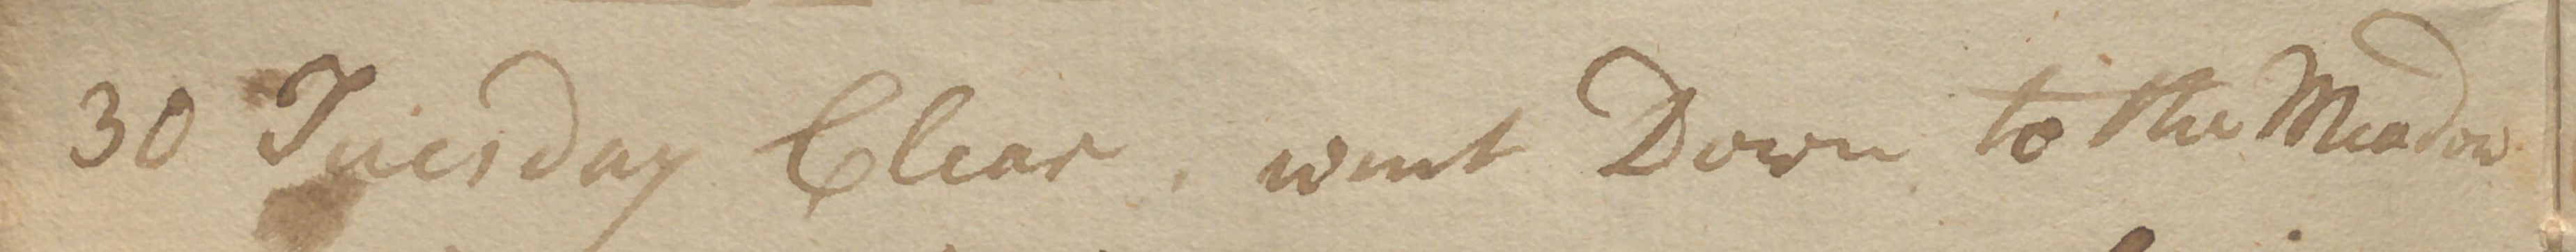30 Tuesday Clear, went Down to the Meadow
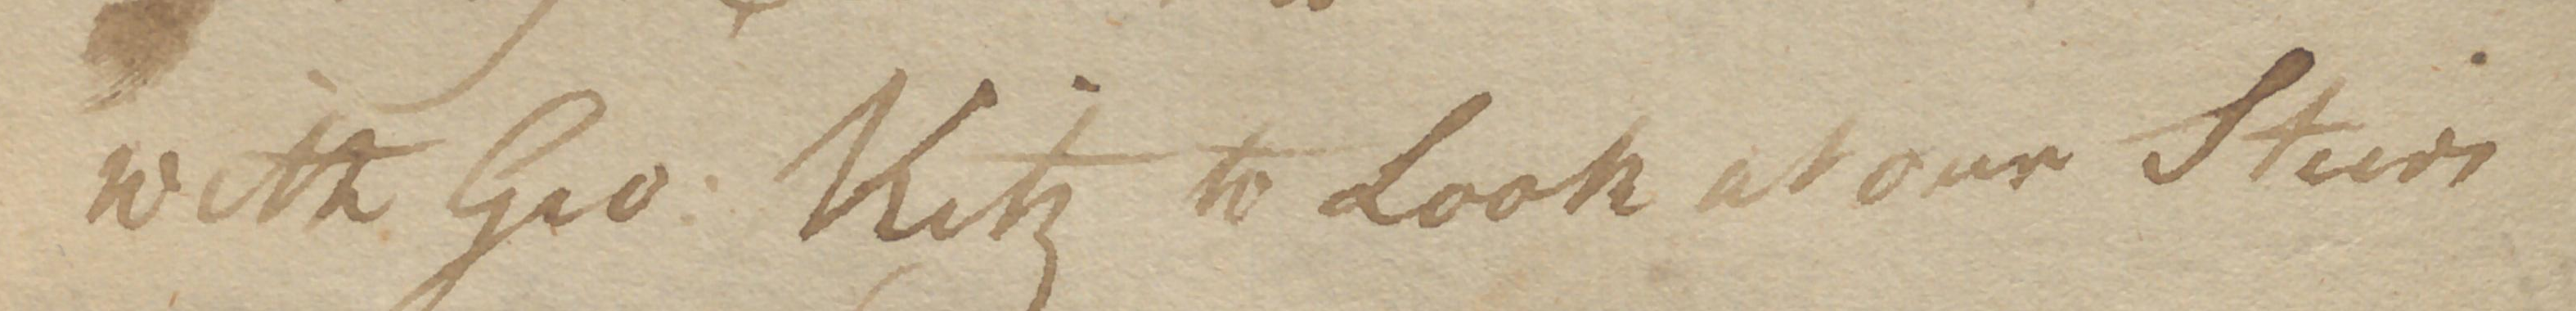with Geo: Kitz to Look at our Steers
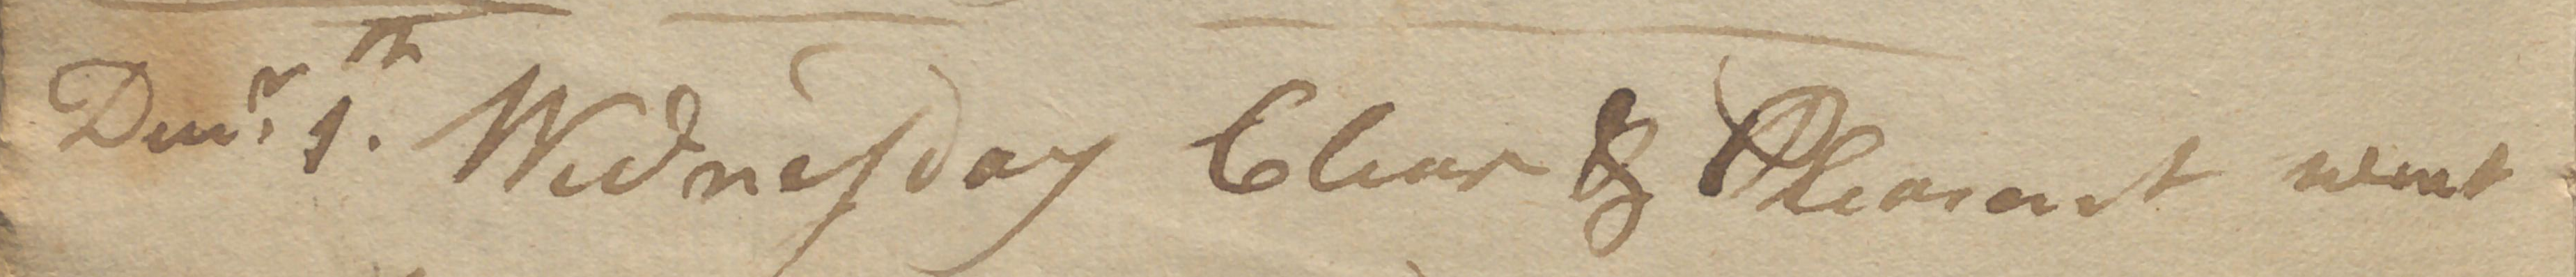Dec^r. 1^th. Wednesday Clear & Pleasent went
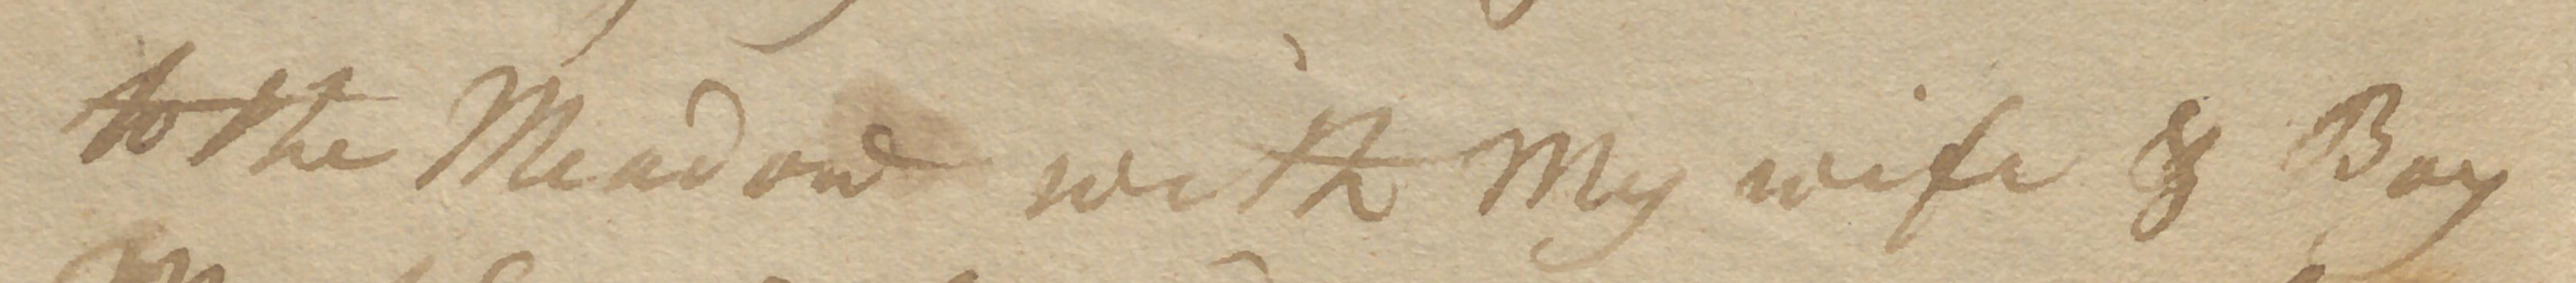to the Meadow with My wife & Boy
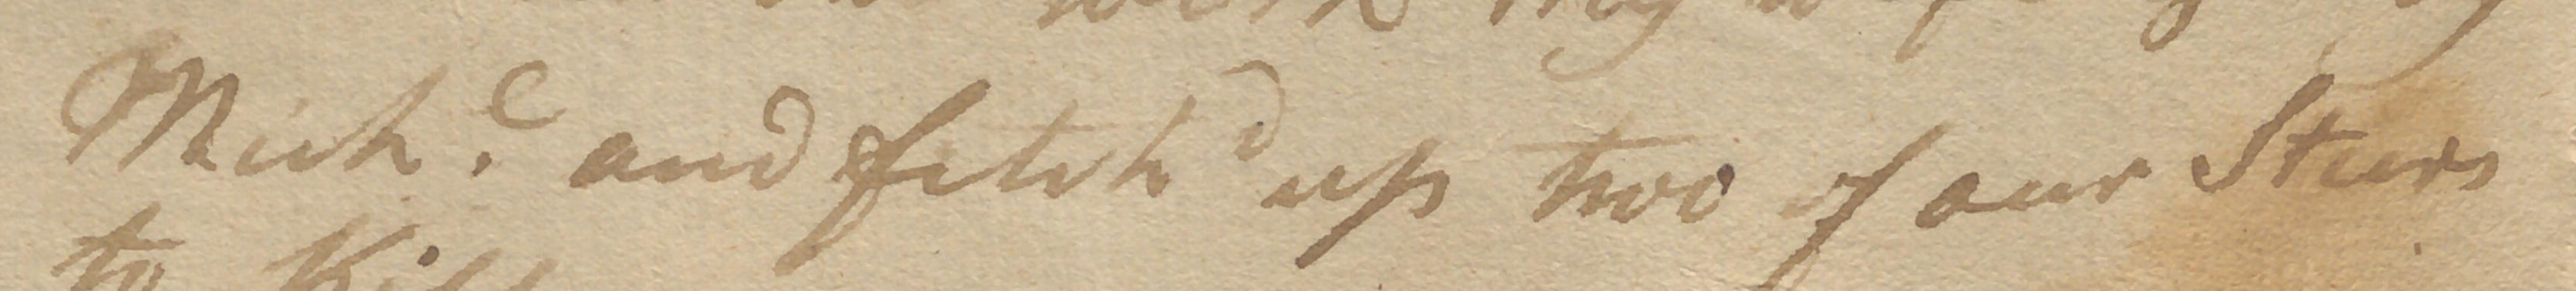Mich^l. and fetch^d up two fo our Steers
